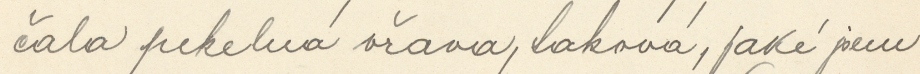čala pekelná vřava, taková, jaké jsem
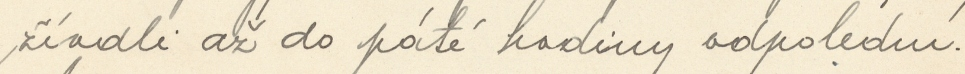žívali až do páté hodiny odpolední.
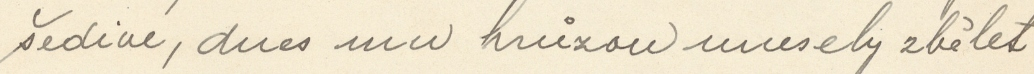šedivé, dnes mu hrůzou musely zbělet.
